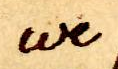we
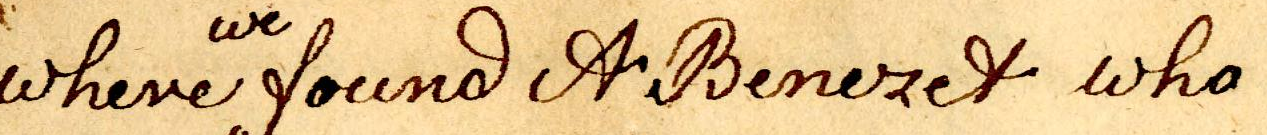where ^ found A Benezet who
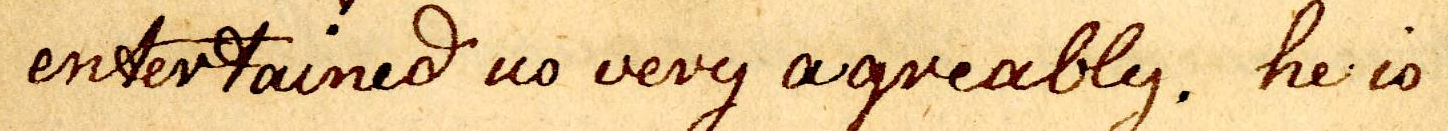entertained us very agreably. he is
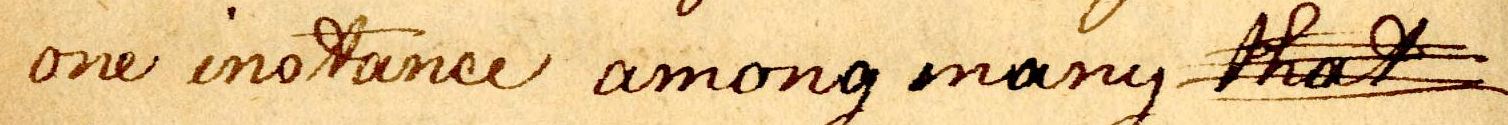one instance among many [that]
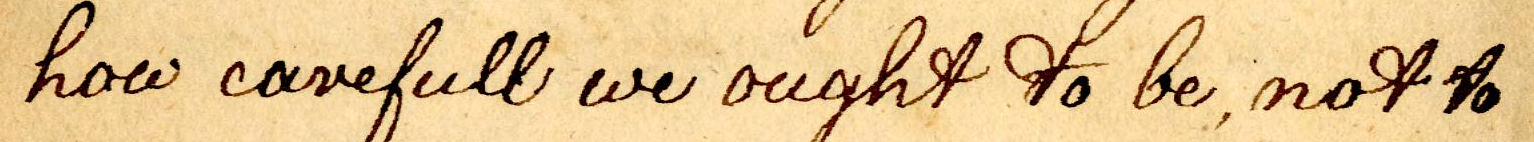how carefull we ought to be, not to
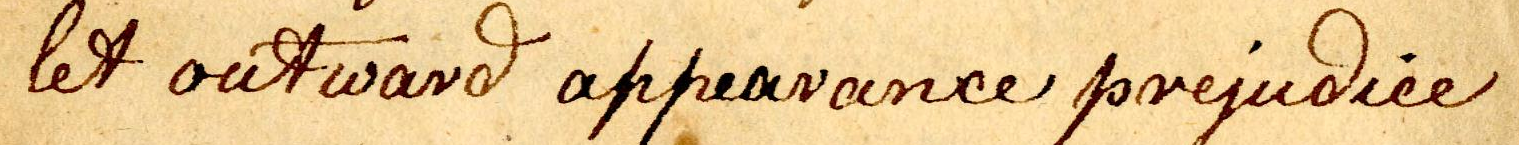let outward appearance prejudice
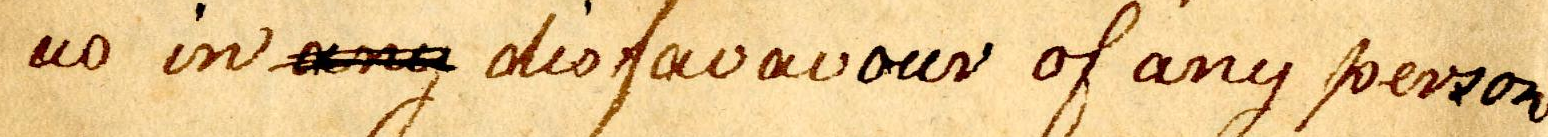us in [any] disfavavour of any person
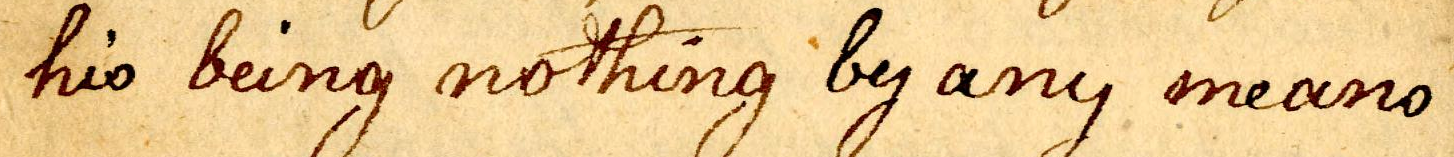his being nothing by any means
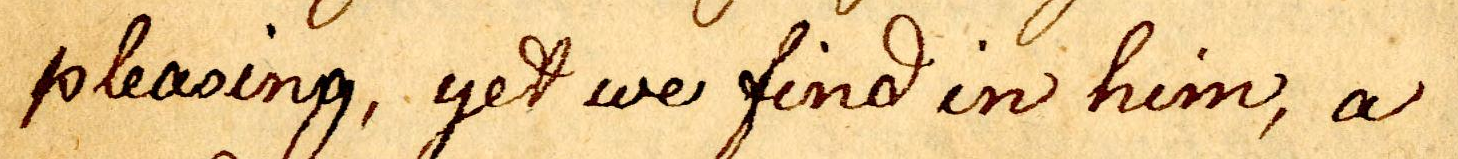pleasing, yet we find in him, a
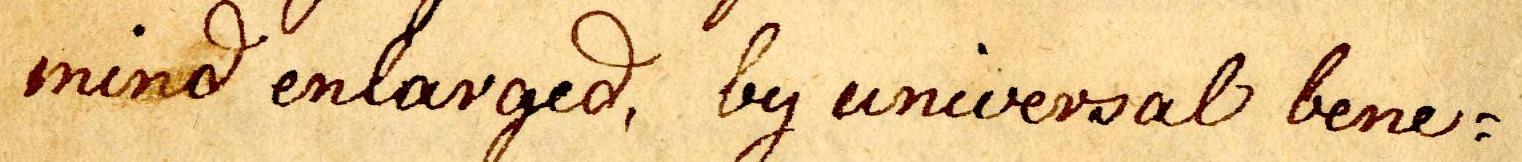mind enlarged, by universal bene-
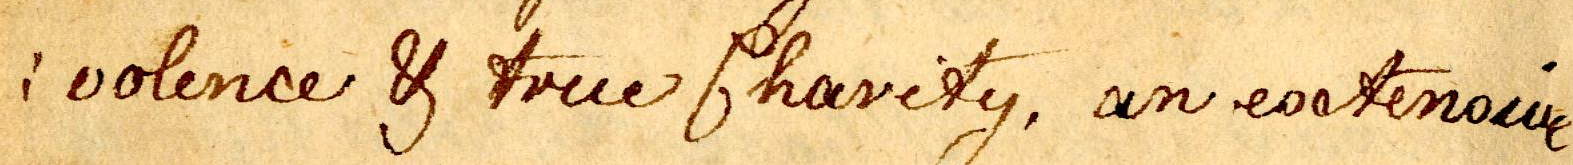-volence & true Charity, an extensive
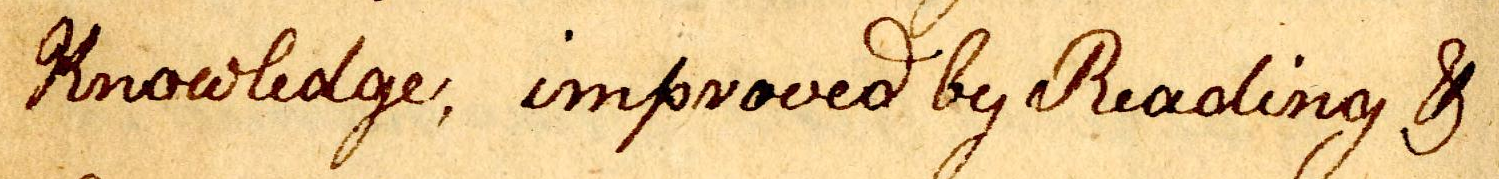Knowledge, improved by Reading &
